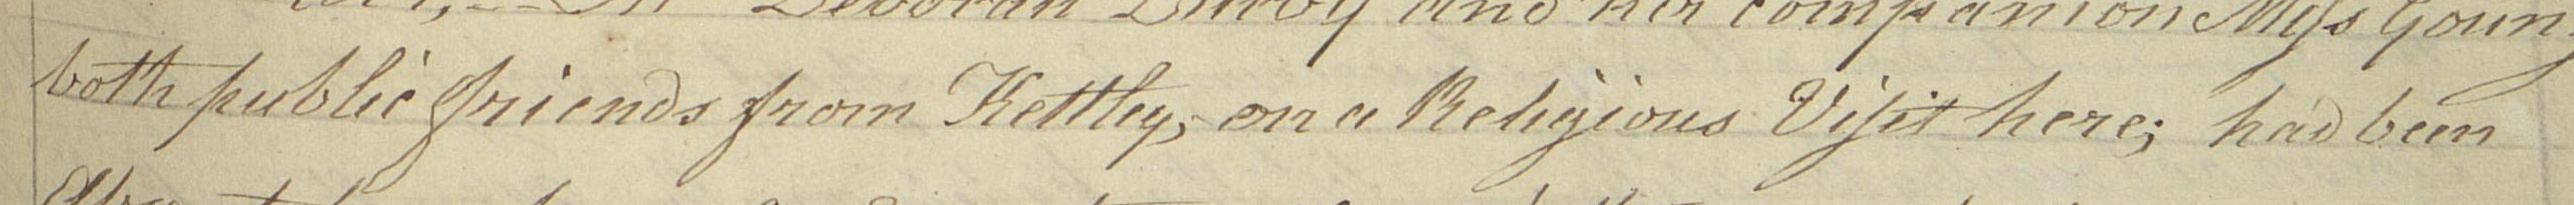both public friends from Kettley, on a Religious Visit here; had been
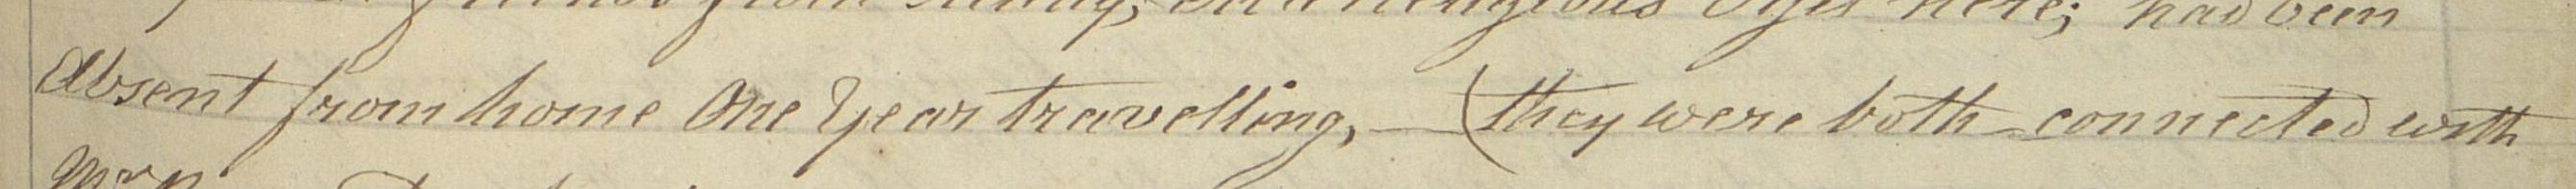Absent from home one Year travelling, (they were both connected with
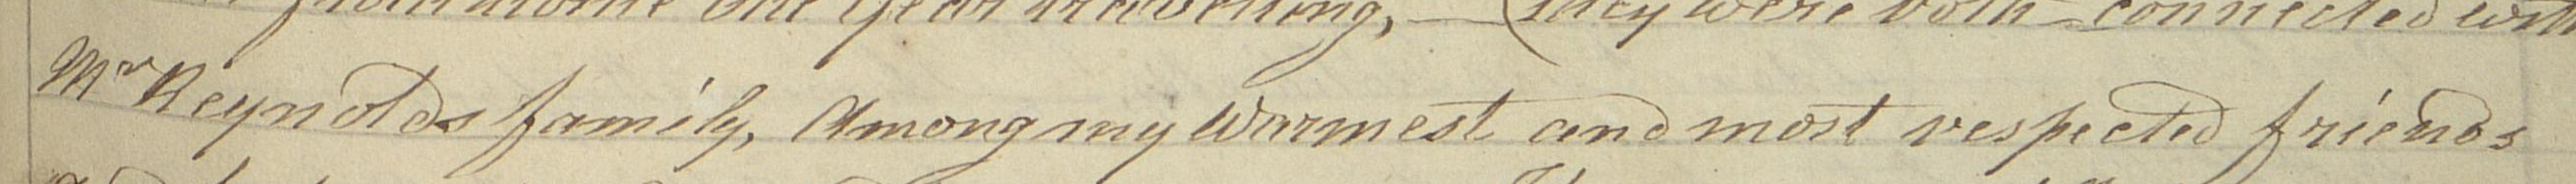M^r. Reynolds family, Among my Warmest and most respected friends
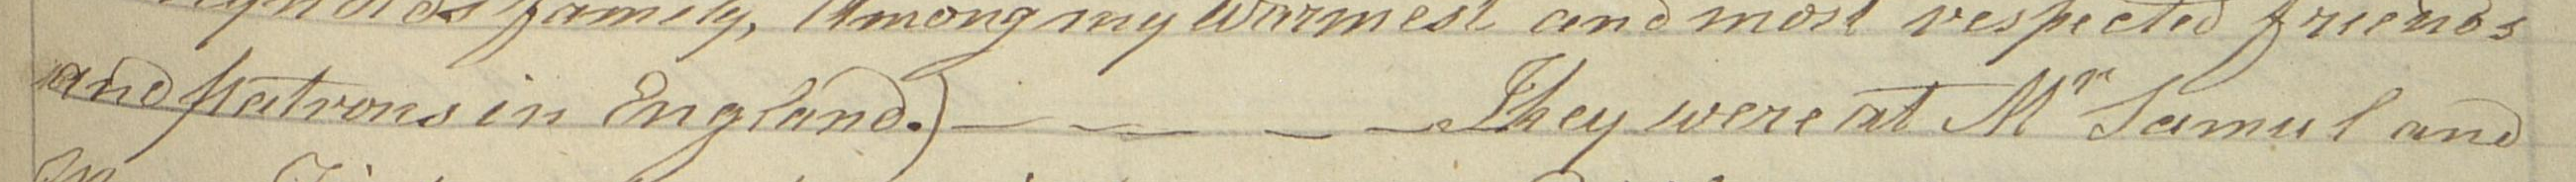and patrons in England.) They were at M^r. Samul and
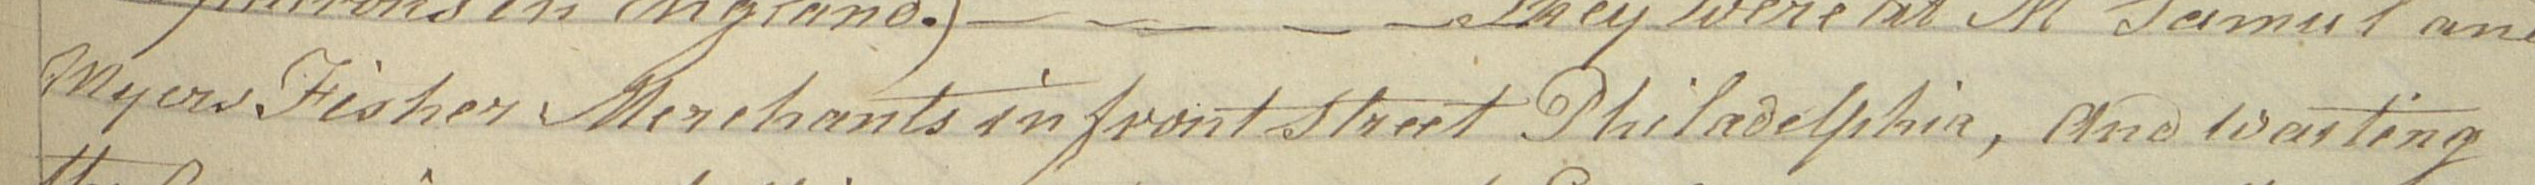Myers, Fisher Merchants in front Street Philadelphia, and Waiting
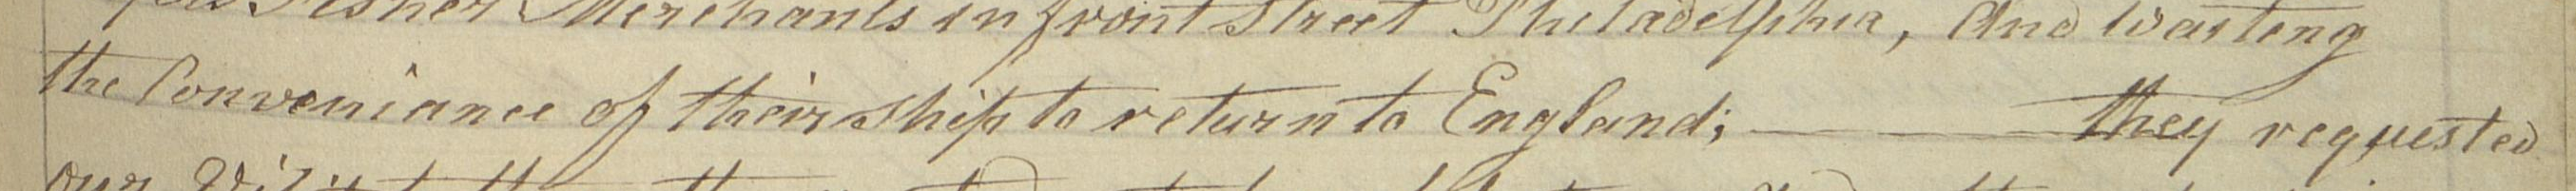the Conveniance of their ship to return to England; they requested
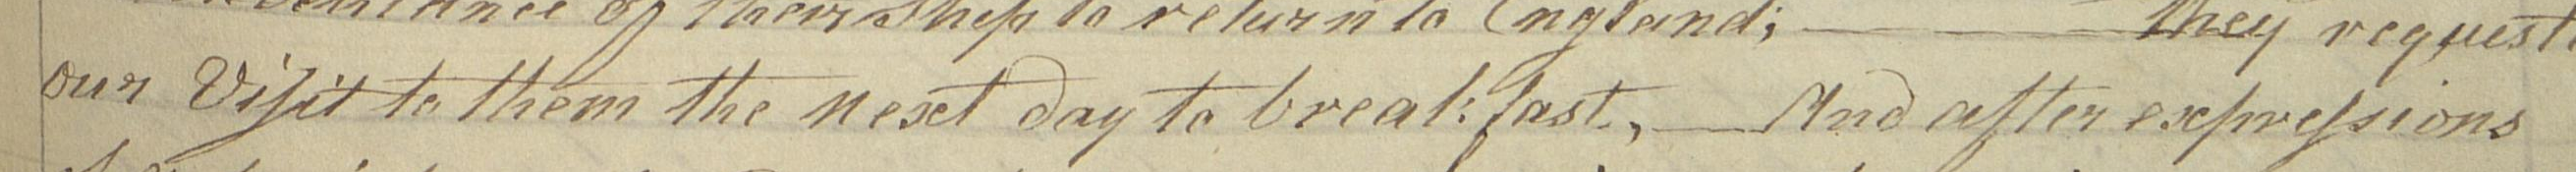our Visit to them the next day to breakfast, And after expressions
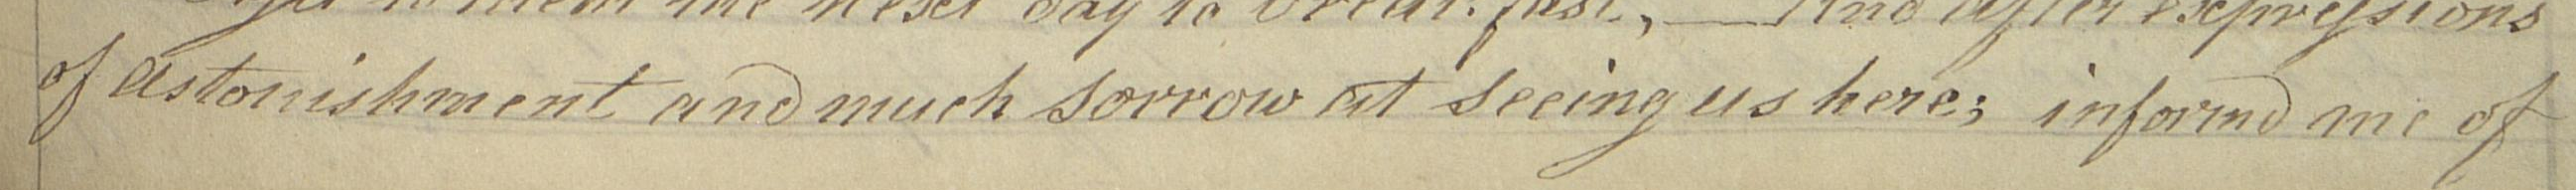of Astonishment and much sorrow at seeing us here; informd me of
